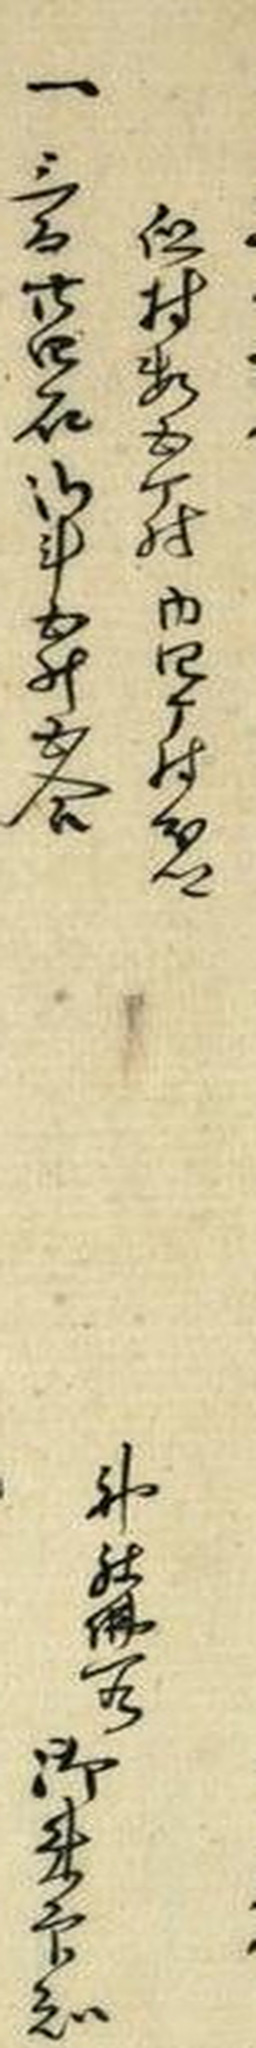一三百廿四石弐斗五升五合神社仏閣御朱印知
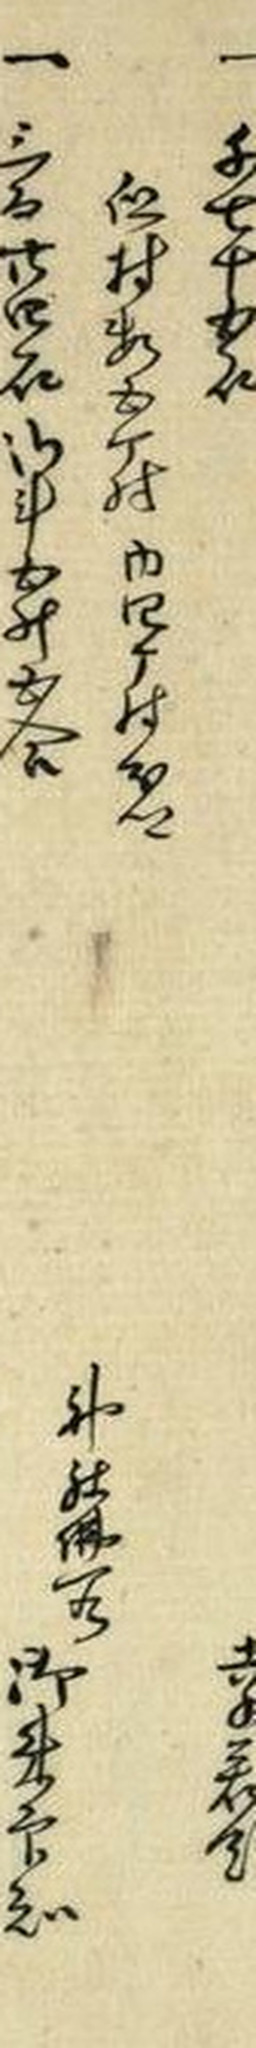一三百廿四石弐斗五升五合神社仏閣御朱印知
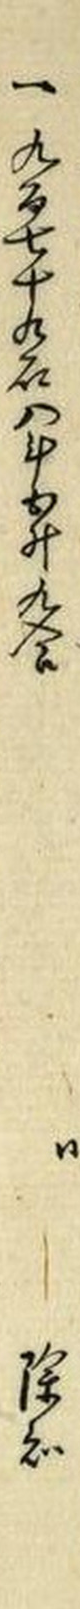一九百七十九石八斗五升九合同除知
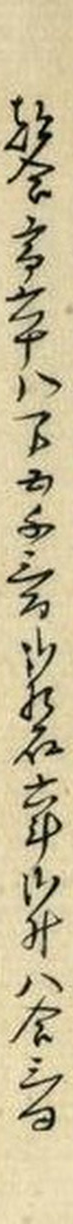都合高六十八万五千三百弐拾石六斗弐升八合三勺
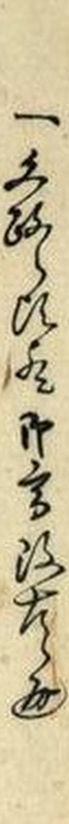一文政之頃歟御高改左之通
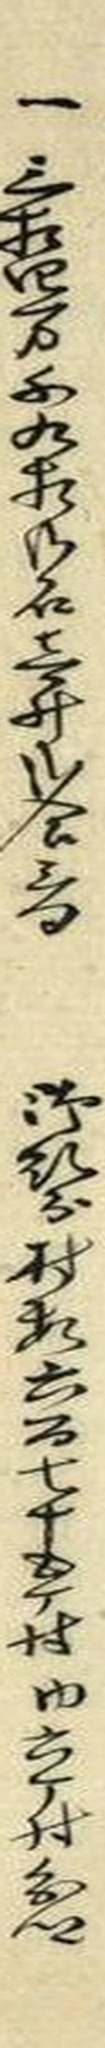一三拾四万千九拾弐石壱升弐合三勺御領分村数六百七十五ケ村内六ケ村分郷
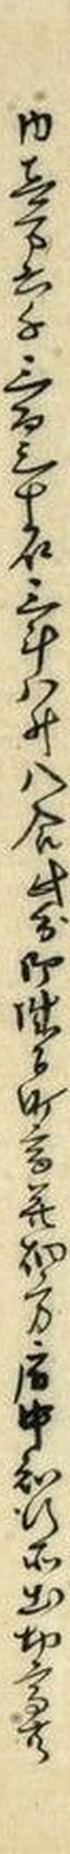内壱万六千三百三十石三斗八升八合此分御城下町高幷畑方府中知行所出切高共
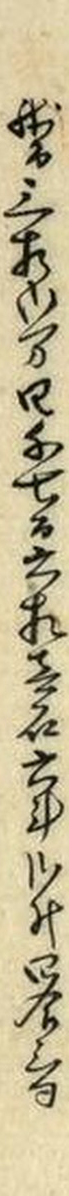残而三拾弐万四千七百六拾壱石六斗弐升四合三勺
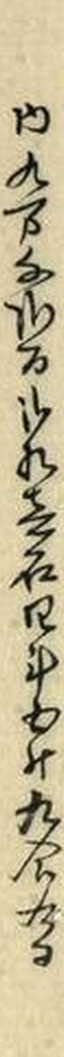内九万千弐百弐拾壱石四斗五升九合九勺上領
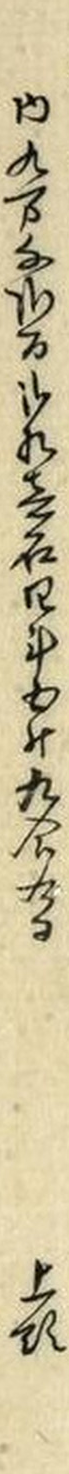内九万千弐百弐拾壱石四斗五升九合九勺上領

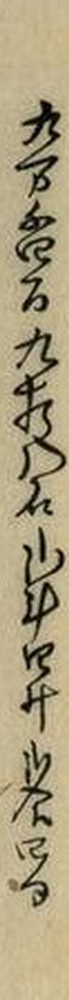九万千四百九拾八石弐斗四升弐合四勺中領
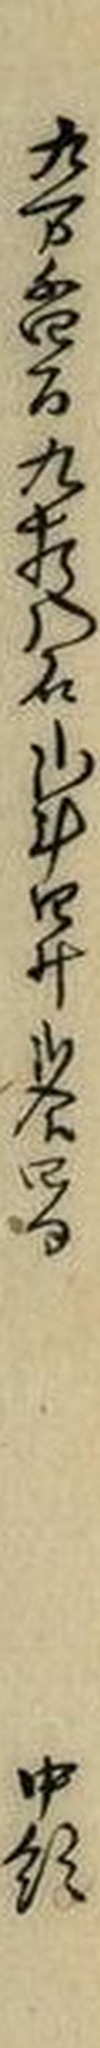九万千四百九拾八石弐斗四升弐合四勺中領
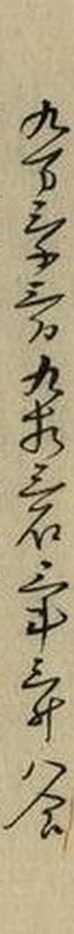九万三千三百九拾三石三斗三升八合下領
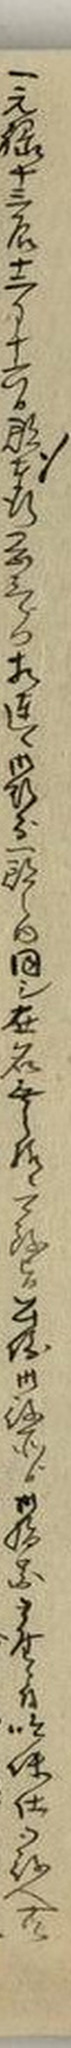一元禄十三辰十二月十六日郡奉行岡三郎右衛門相達候御領分一郡之内同シ在名無之様ニ可致旨公儀御役所ゟ御指図御座候ニ付吟味仕御役人共
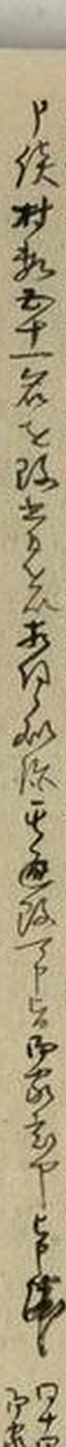申談村数五十一名を改書付を以相伺候処弥其通改可申旨御家老中被申渡候
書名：御国他国諸事之部
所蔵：福井県文書館 Fukui Prefectural Archives
